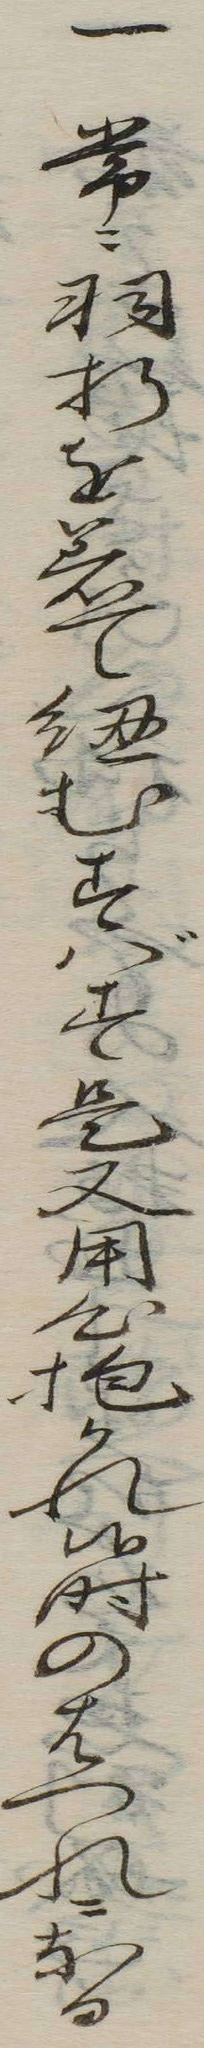一常ニ羽折を着て紐むすばす是又用心抱かれ候時のはつれニなる
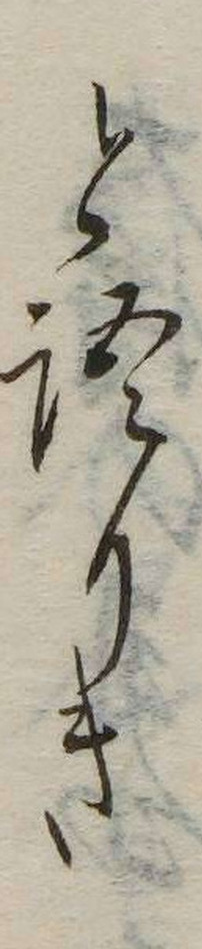と語りき
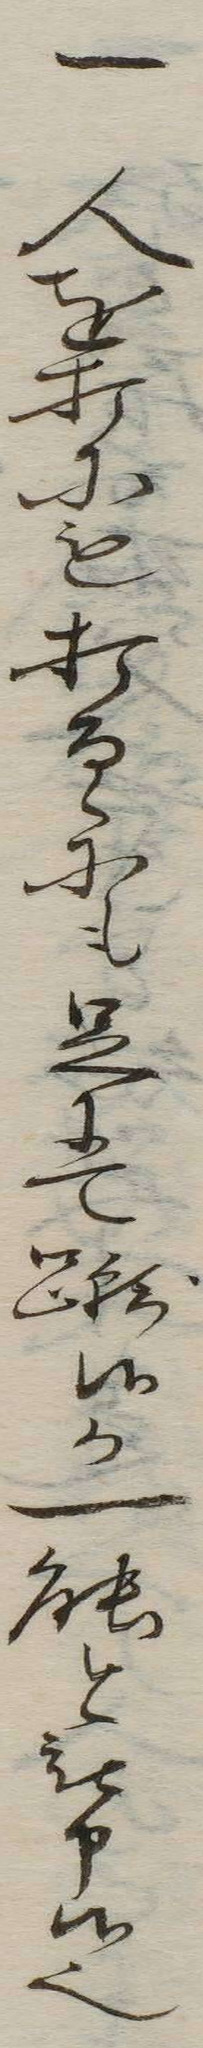一人を打にも打るゝにも足にて蹴候か一能と被申候也
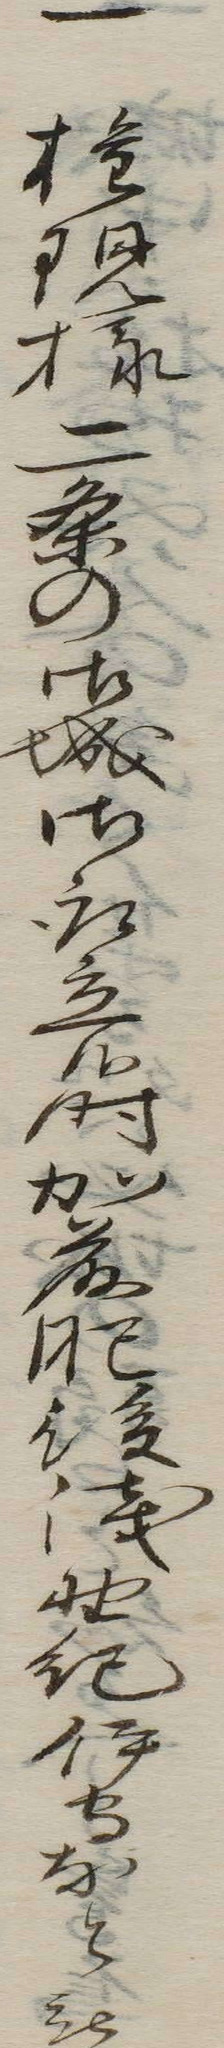一権現様二条の御城御取立候時加藤肥後浅野紀伊守なと被
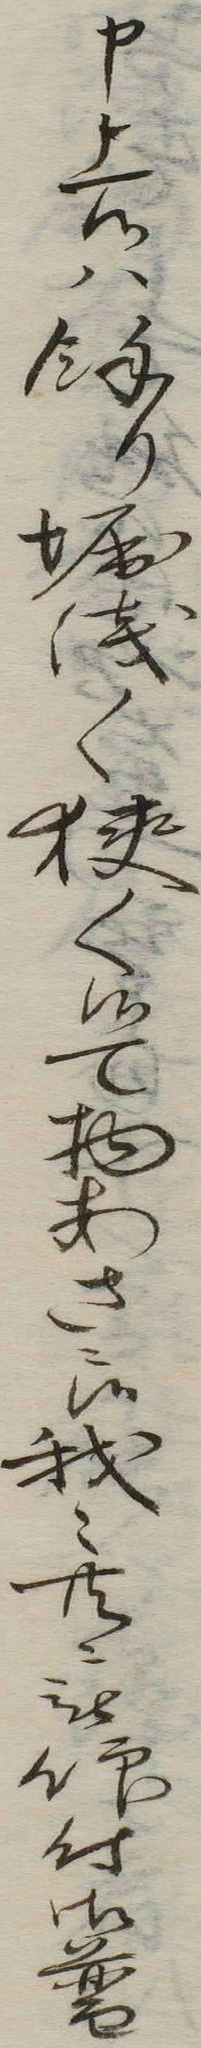申上候は余り堀浅く狭く候て物あさニ候我々共ニ被仰付御普
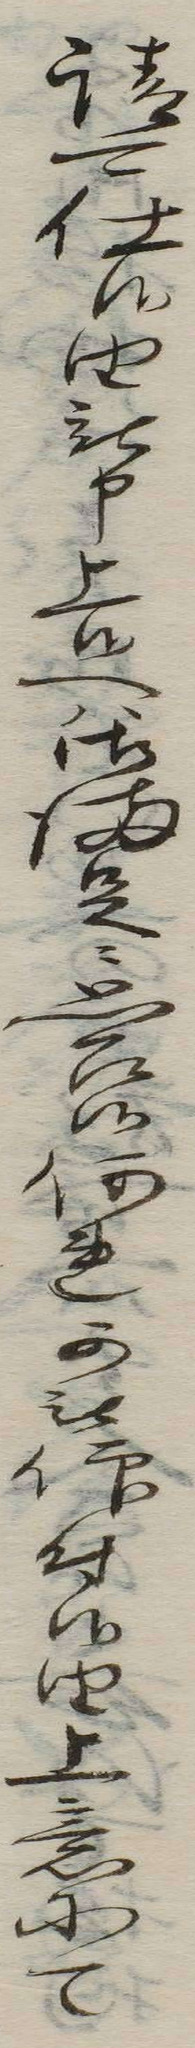請可仕候由被申上候へは御帰足ニ思召候何れか被仰付候由上意にて
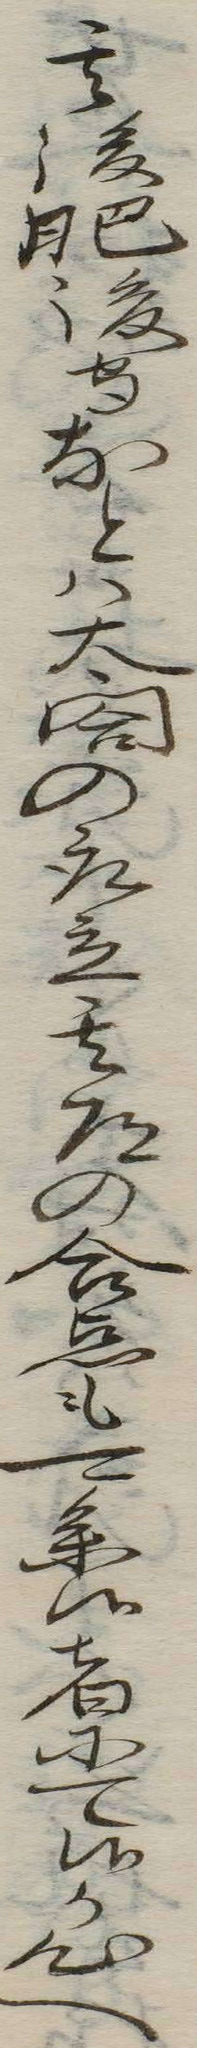其後肥後守なとは太閤の取立其道の合点も可参候者にて候か心へ
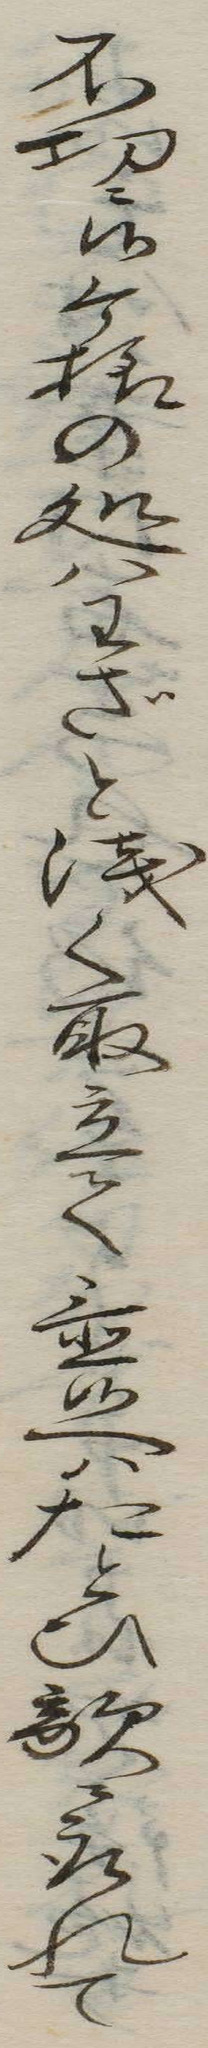不切ニ候ケ様の処はわざと浅く取立て置候へはたとひ敵ニ取れて
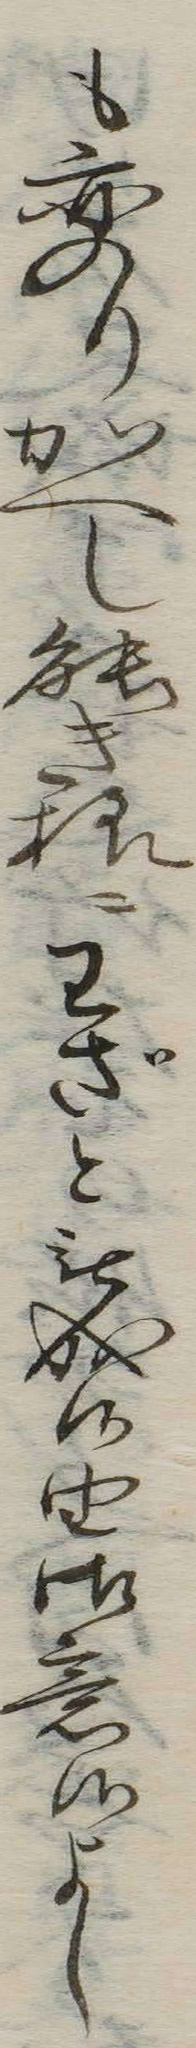も亦のりかへし能き様ニわざと被成候由御意候よし
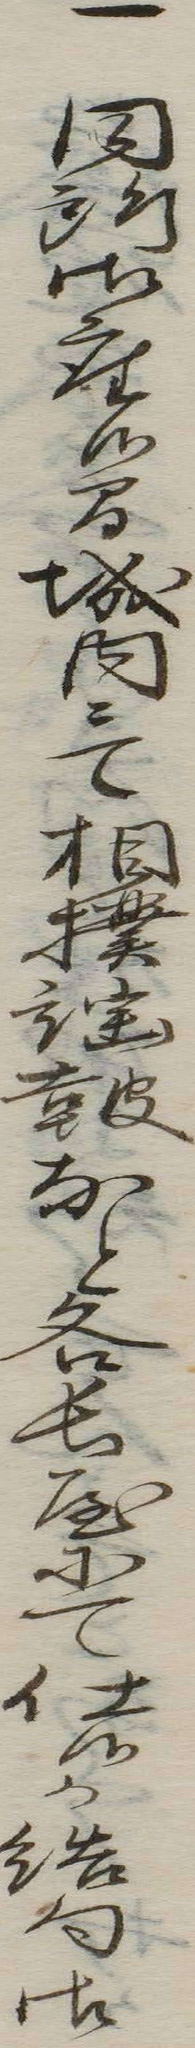一同所御座候間城内ニて相撲謡鼓なと各長屋にて仕候か結句御
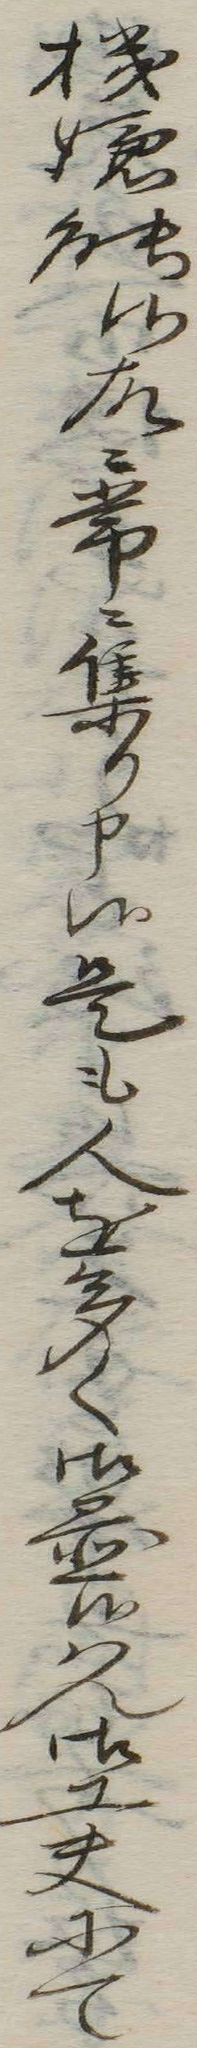機嫌能候故ニ常ニ集り申候是も人を多く御置候はん御工夫にて
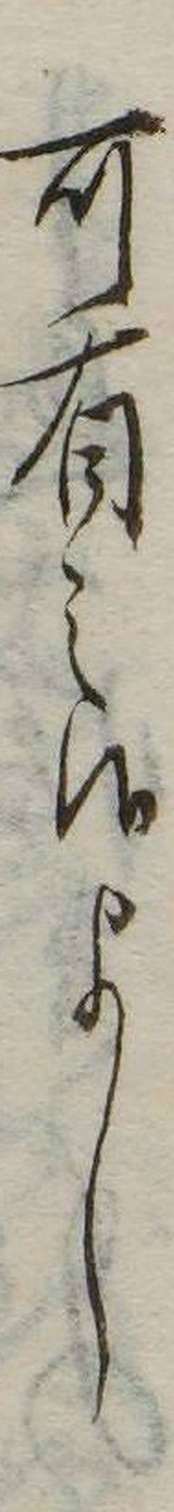可有是候よし
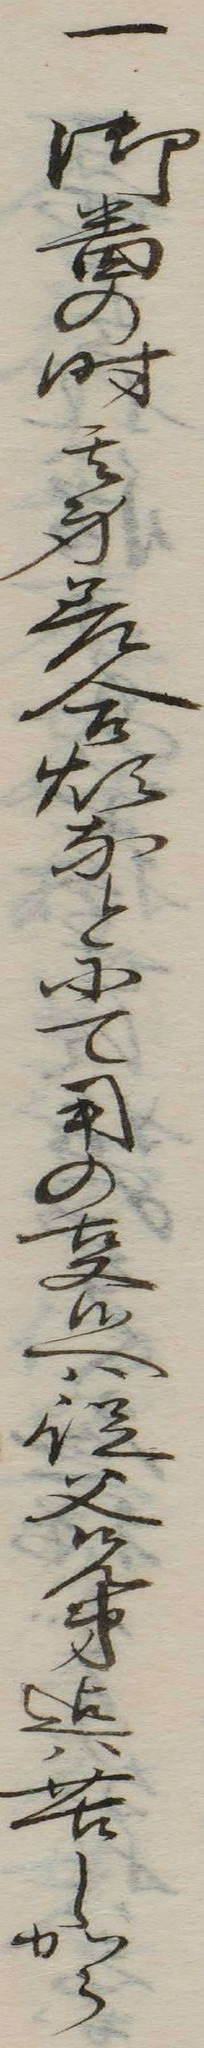一御番の時其身差合煩なとにて用の事候へは従父兄弟迄は苦しから
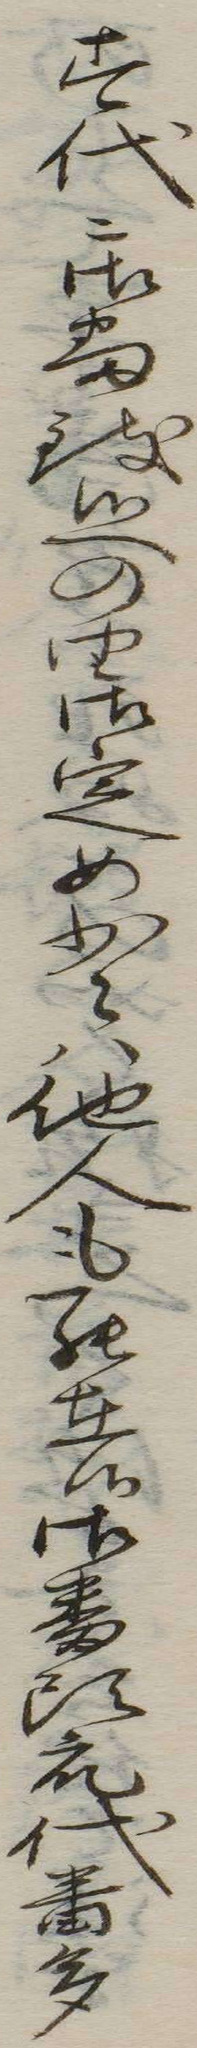す代ニ御当致候への由御定め少々は他人も罷在候御番頭衆代番多
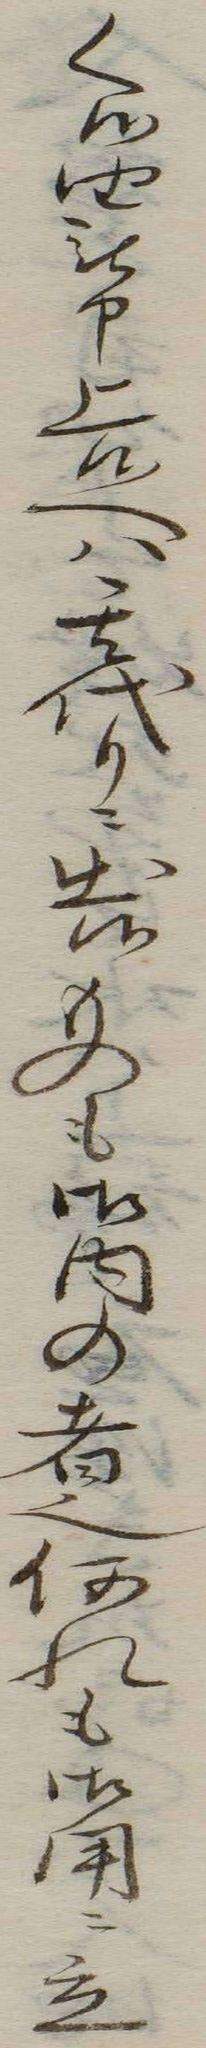く候由被申上候へは其代りニ出候ものも御内の者也何れも御用ニ立
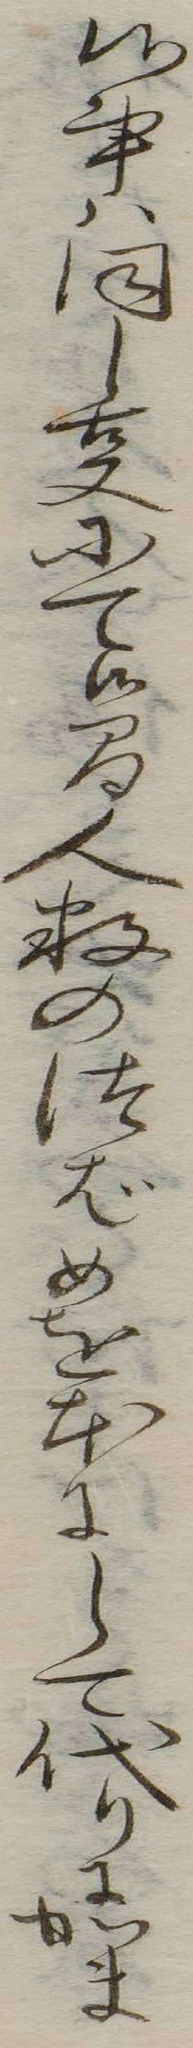候事は同じ事にて候間人数のつばめを本にして代りにかま
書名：三河之物語
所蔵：国文学研究資料館
